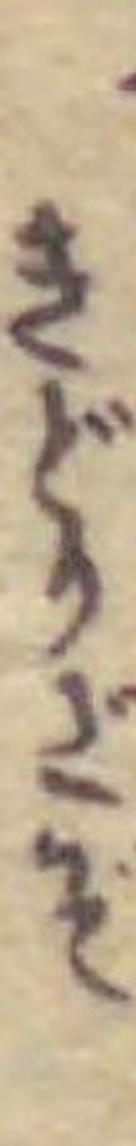きどりだぞ
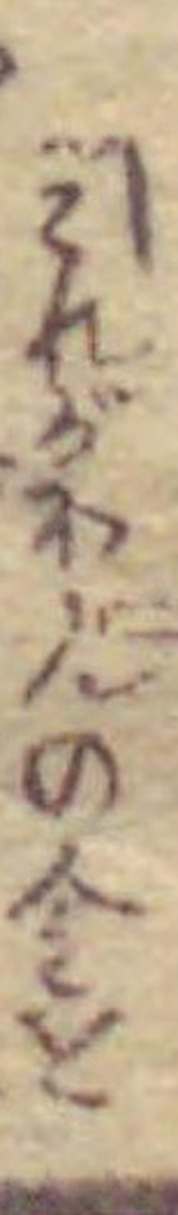〽これがほんの金を
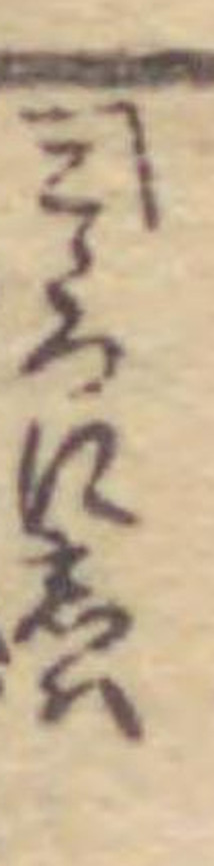〽こゝろにしは
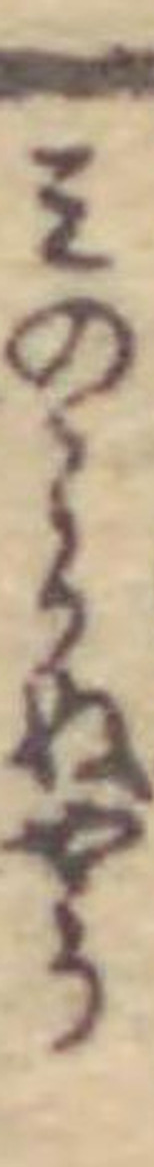みのこらぬやう
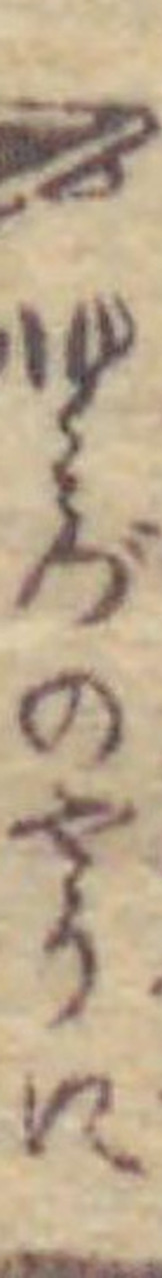ゆみづのやうに
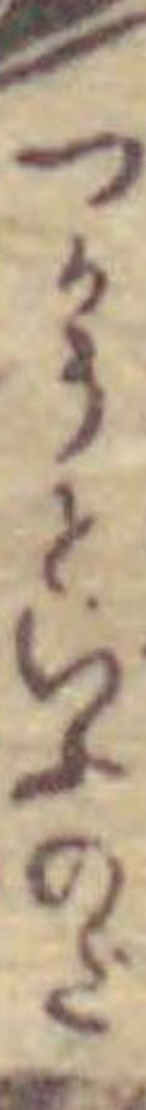つかうといふのだ
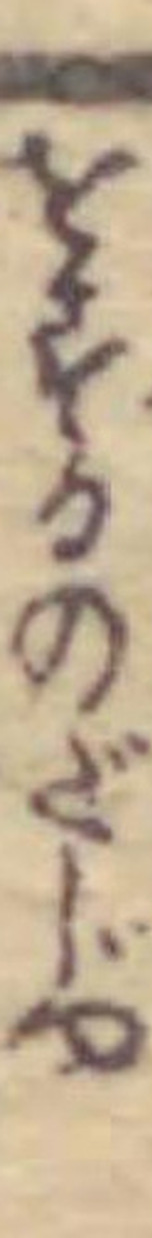をするのだじゆ
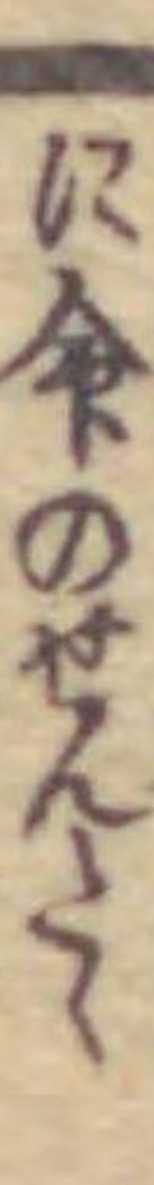に命のせんたく
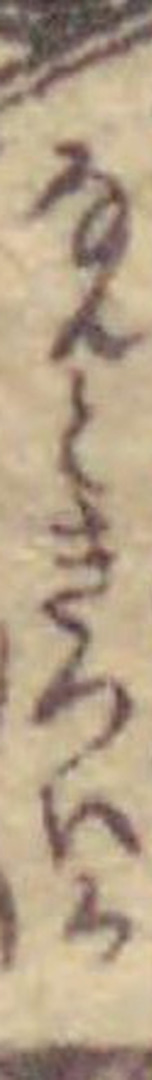なんときついか
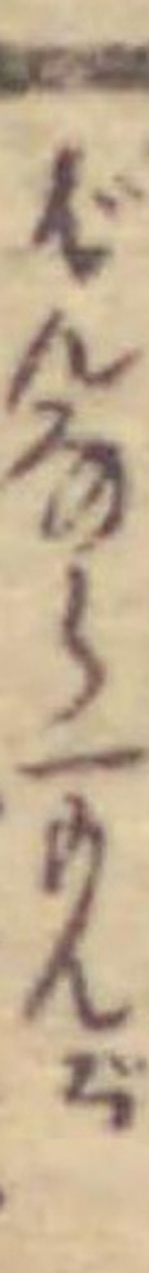ばんなら一もんぢ
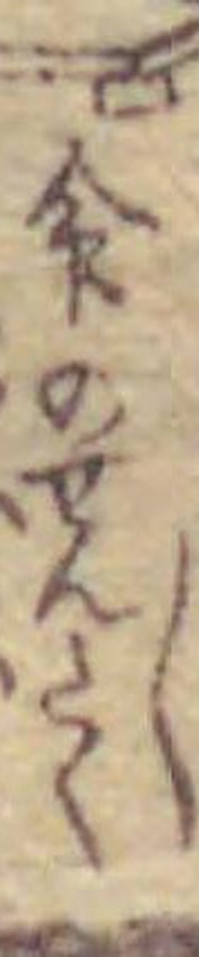に命のせんたく
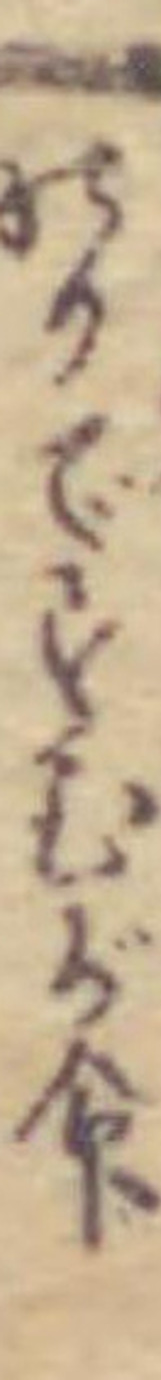のりですむが命
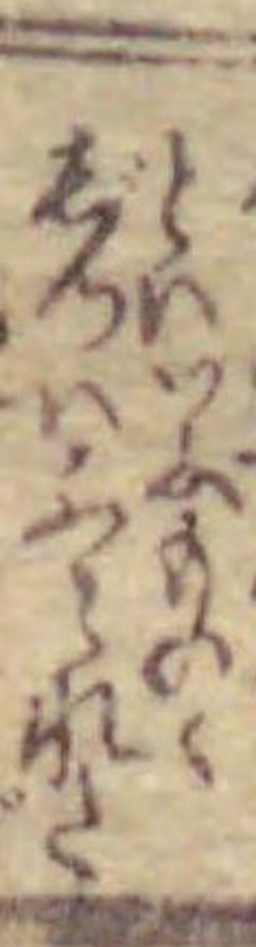じつはふられた
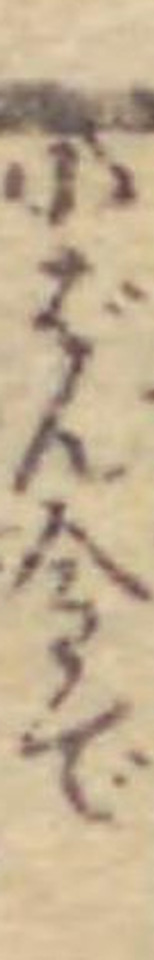小ばん金で
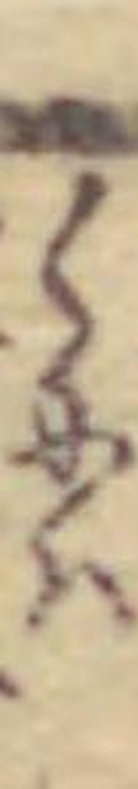くには
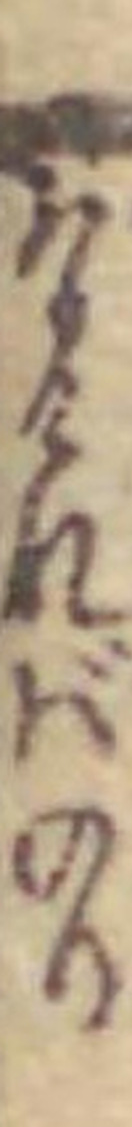なければのり
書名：御誂染長寿小紋 : 3巻
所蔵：国立国会図書館 National Diet Library, JAPAN
